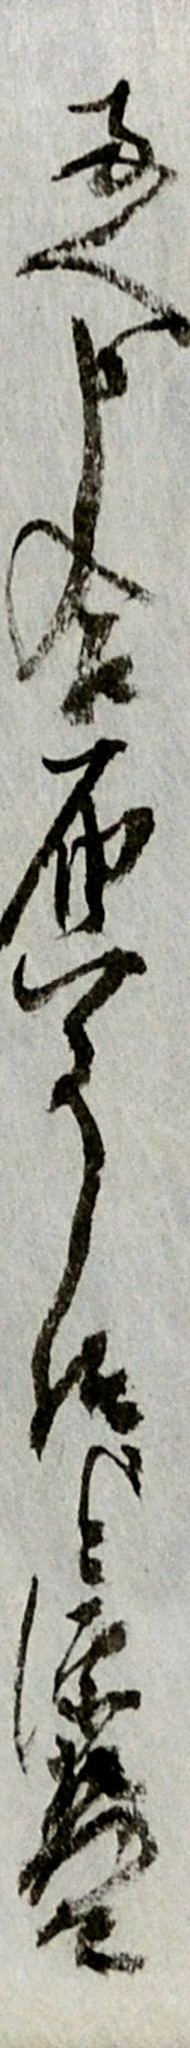両人申合届可仕候様にと源左衛門
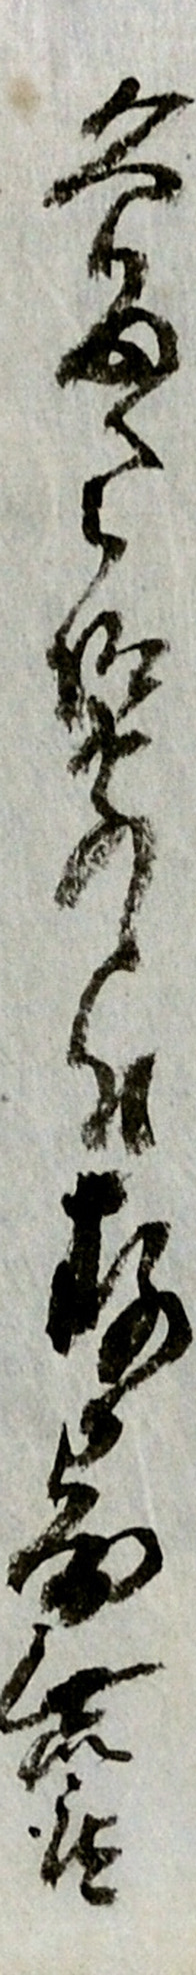久島へ被仰聞候付存候間無御座候
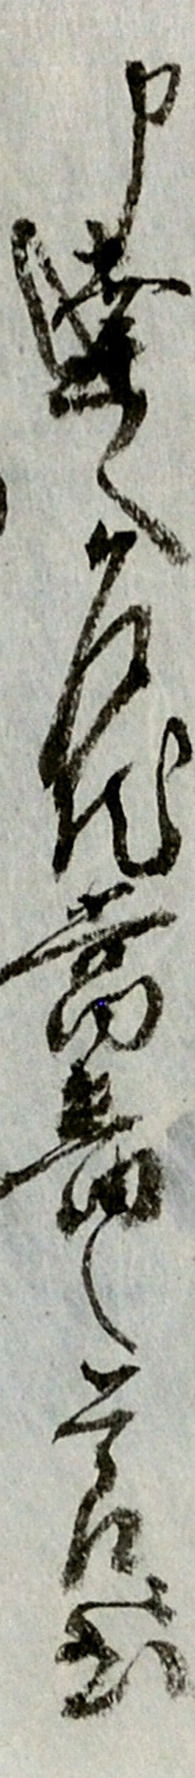申達候乍然当春之節に出
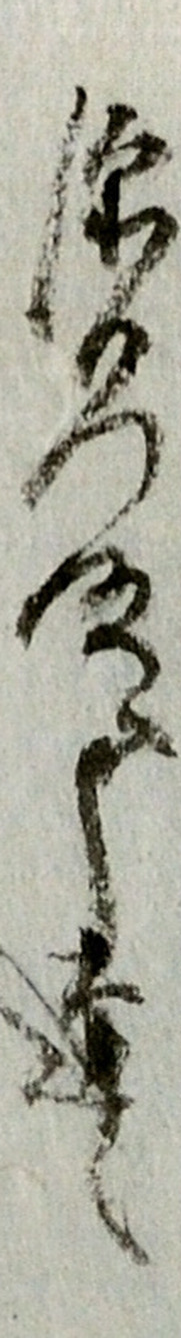源左衛門殿へ申達候
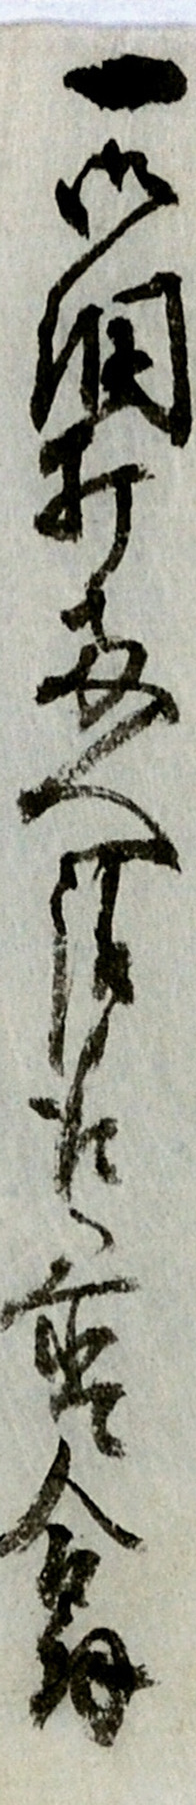一御網打両人請取置候合羽
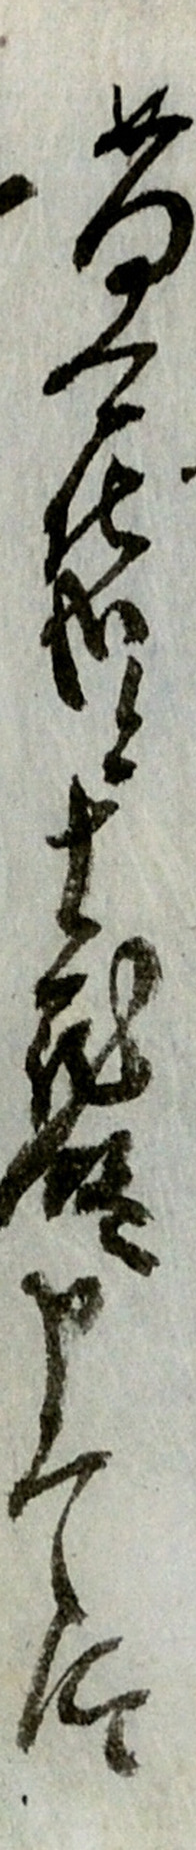如何可仕哉と十蔵殿へ申上候所
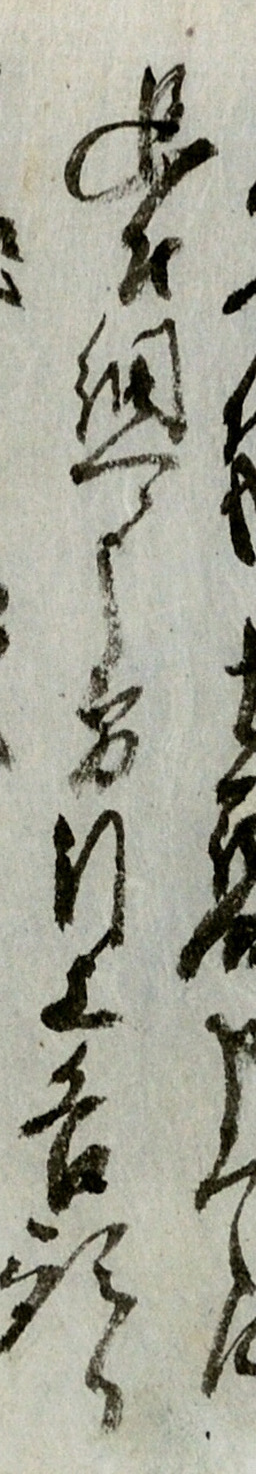追付調可申候旨引上各預り
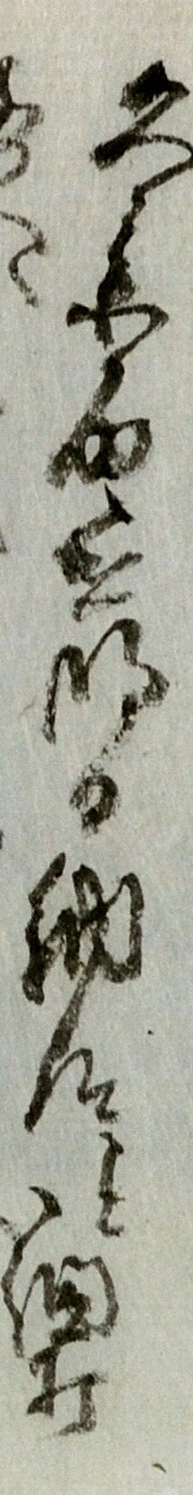久兵衛届遣明日納屋にて御網打
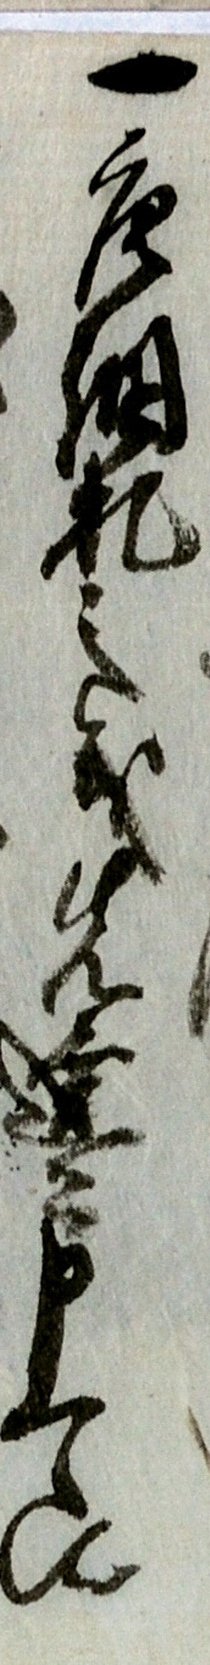一唐網札之義先達而申上候所
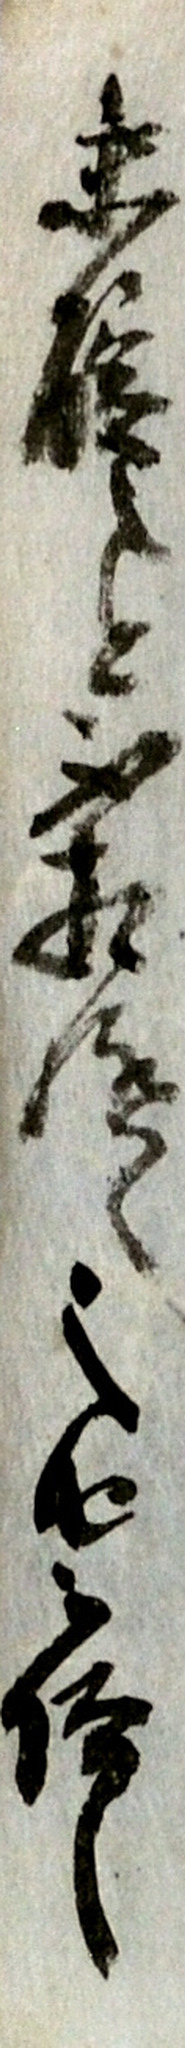未聢と不相渡候之由被仰候

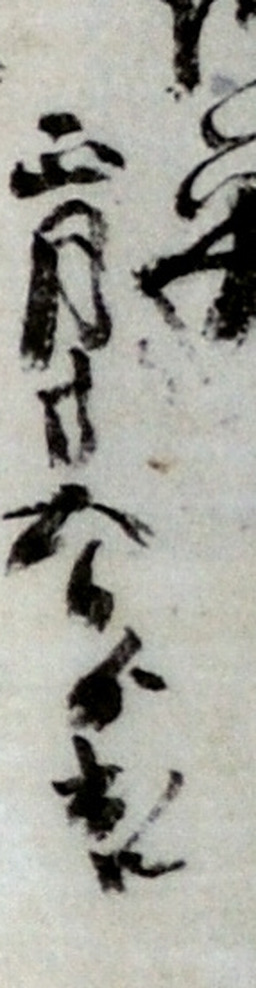二月廿八日ゟ出
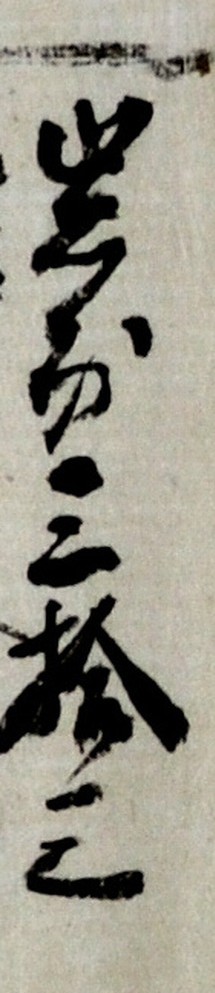千百三拾三
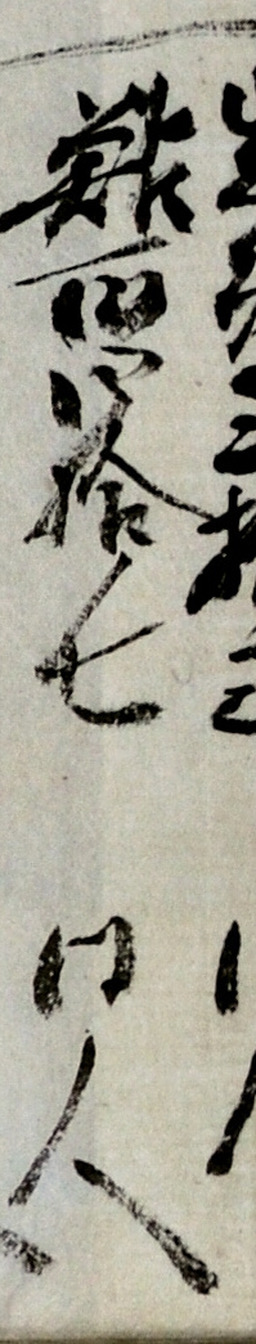鮎百四拾七同人
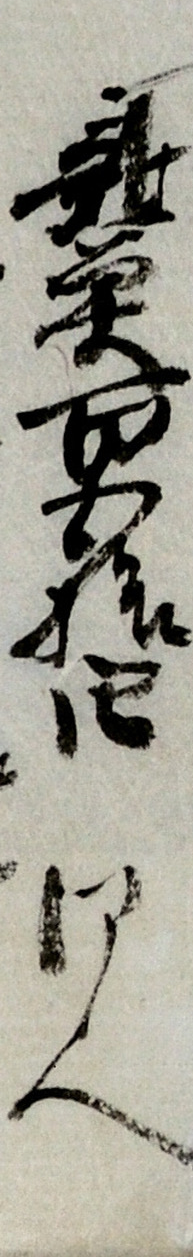内雑魚百五拾四同人
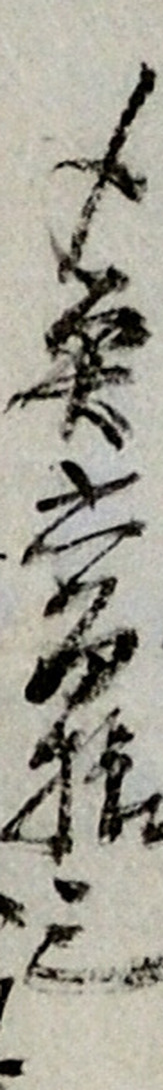〆魚六百拾三
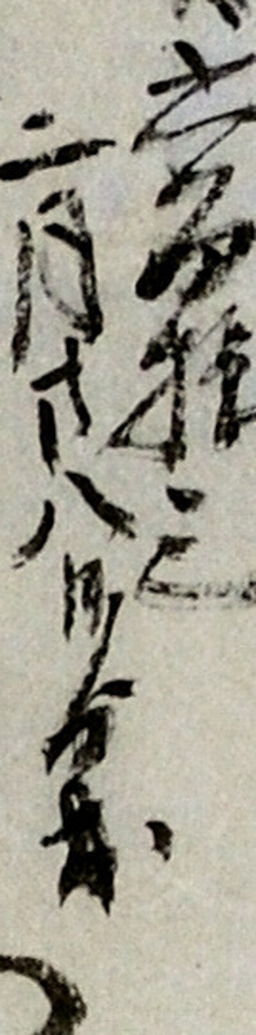二月廿八日ゟ出
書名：分一方諸事御用留帳
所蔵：伊那市立高遠町図書館・合同会社AMANE
